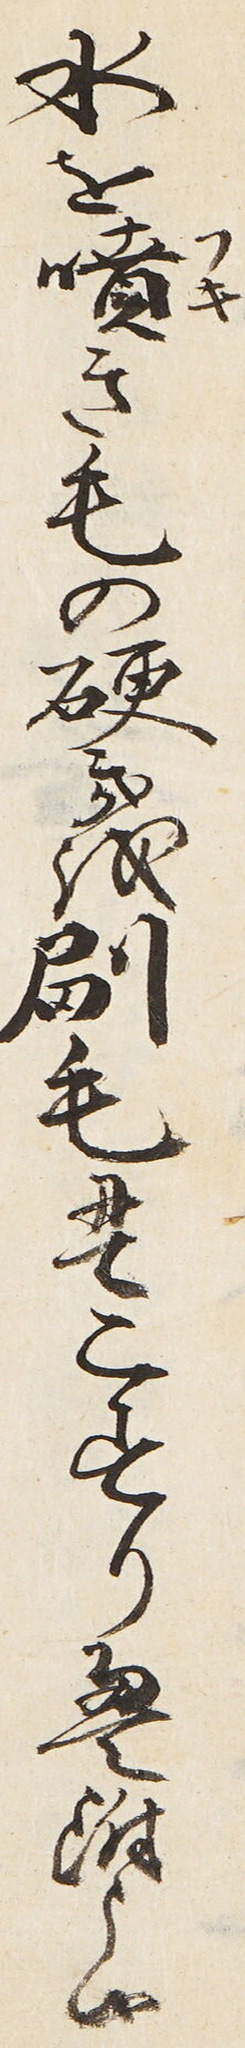水を噴き毛の硬きを刷毛にてこすり畳附申候
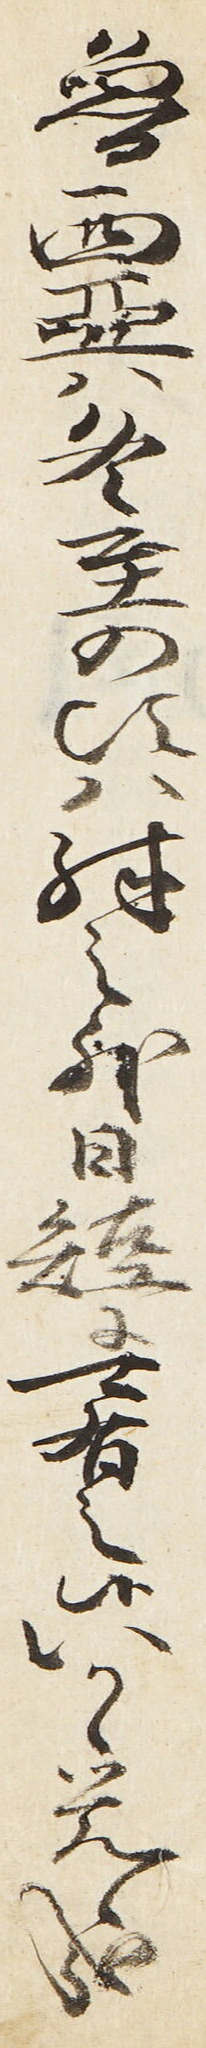魯西亜は冬至の頃は殊の外日短に可有之候いかゝ覚候哉
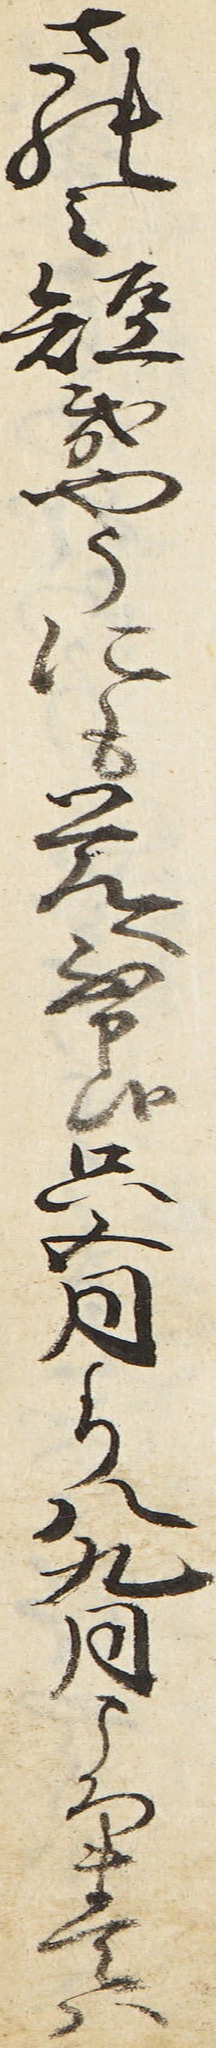さのみ短きやうにも覚へ不申候只五月より八九月ころまては

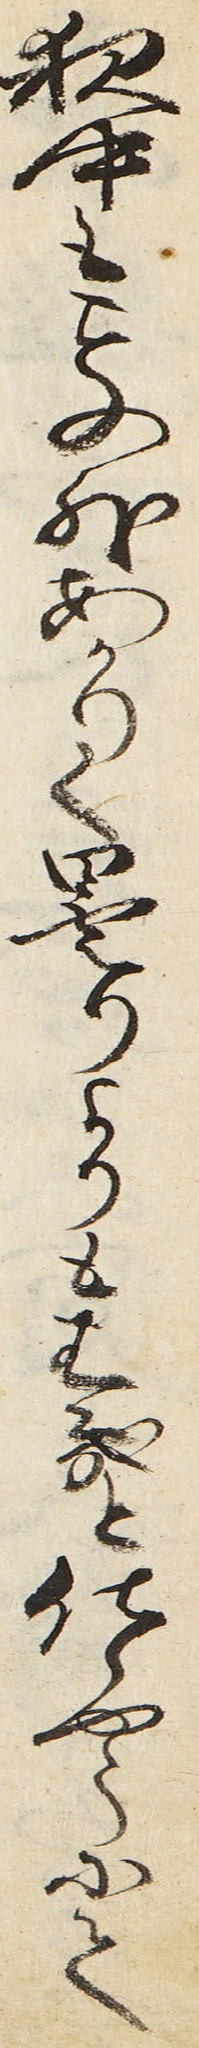夜中もことの外あかりく曇りよりもはきと仕候やうにて
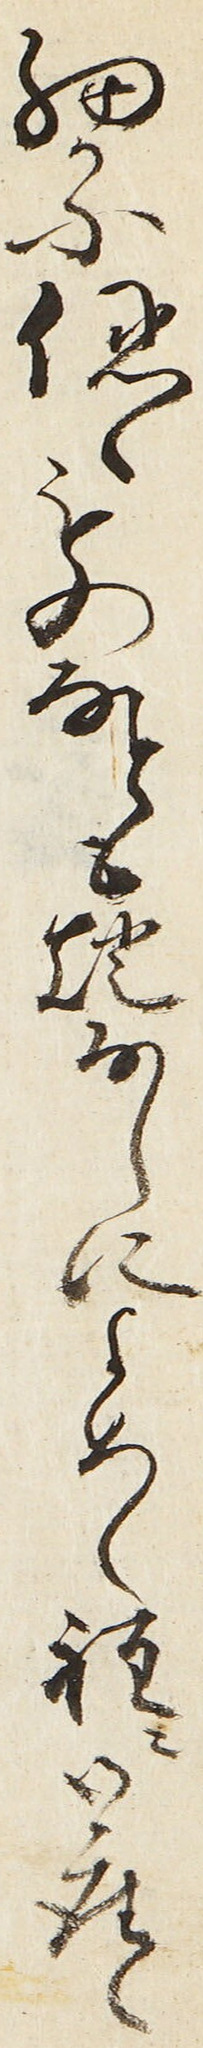細かに使候ものなとも燈なしによめし程に御座候
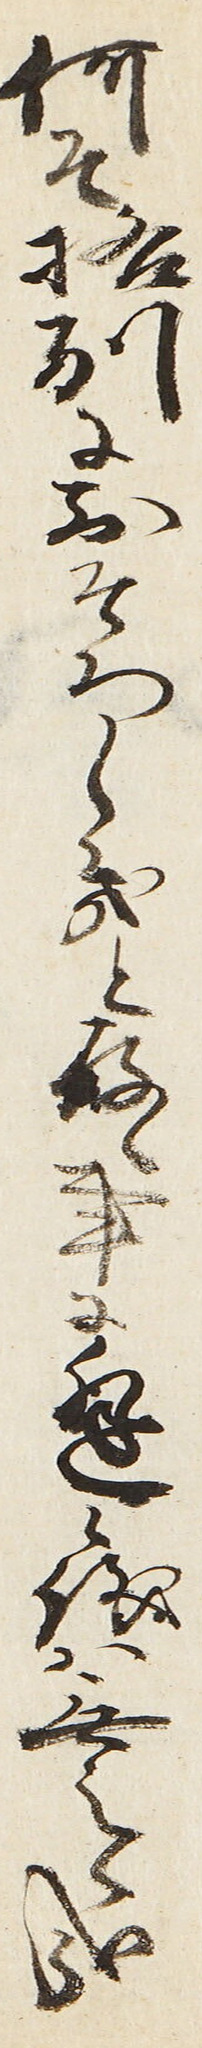何そ格別におそろしきと存候事に逢候義は無之候哉
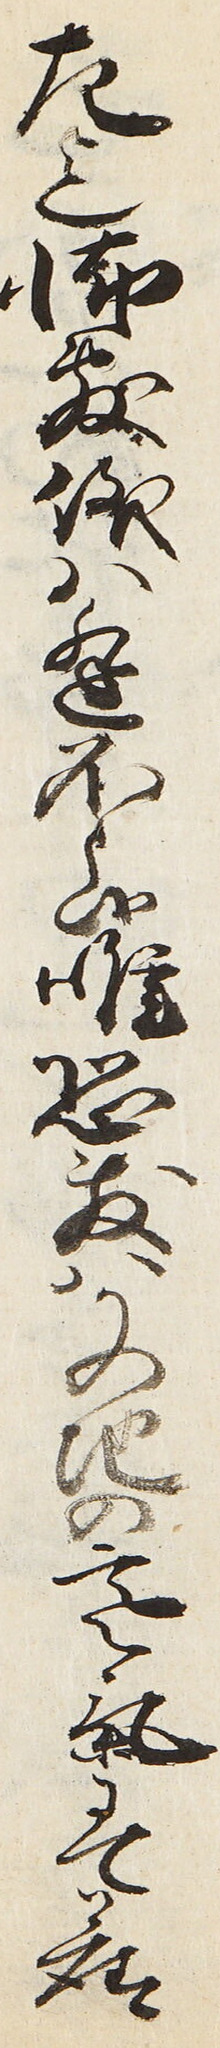左迄怖敷儀は逢不申候唯恐敷はかの地の寒気にて御座候
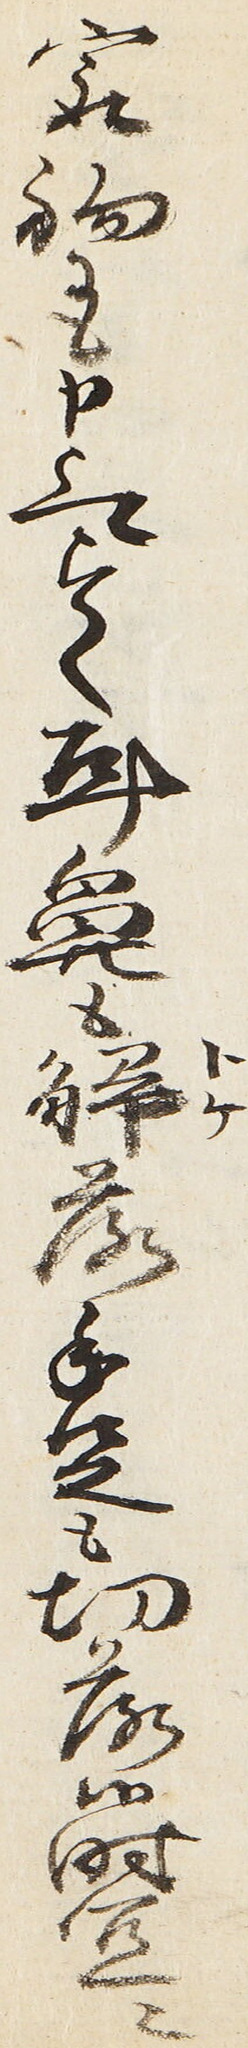最初にも申上候ことく耳鼻も解落手足も切り落候時宜に
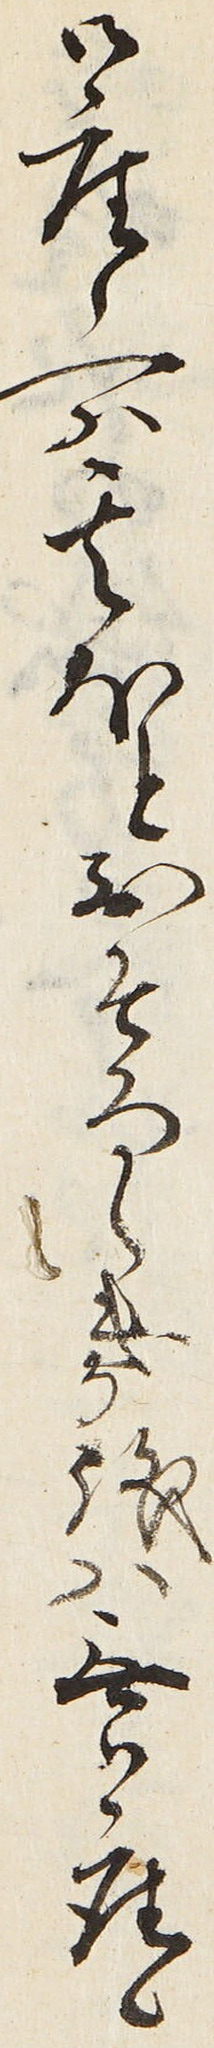御座候へは其ほとおそろしき儀は無御座候
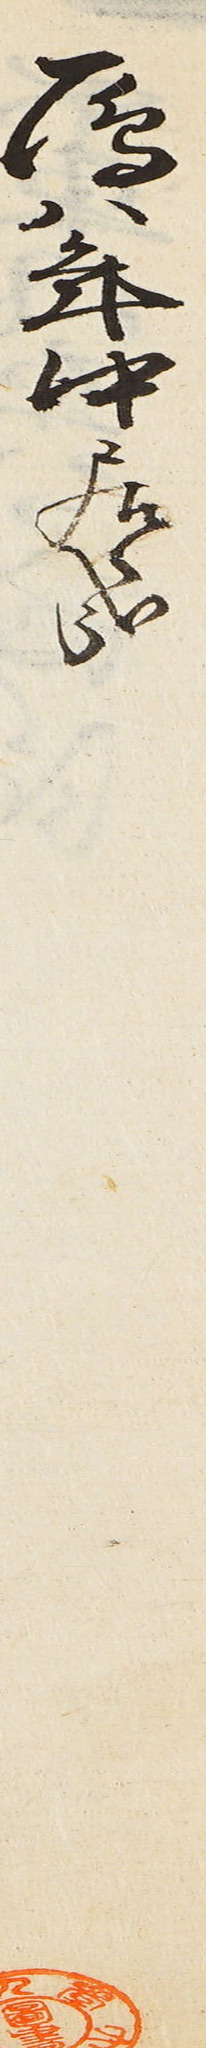雁は年中居候哉
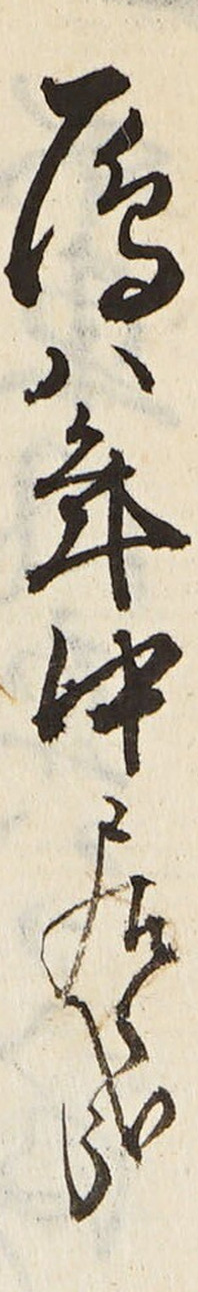雁は年中居候哉
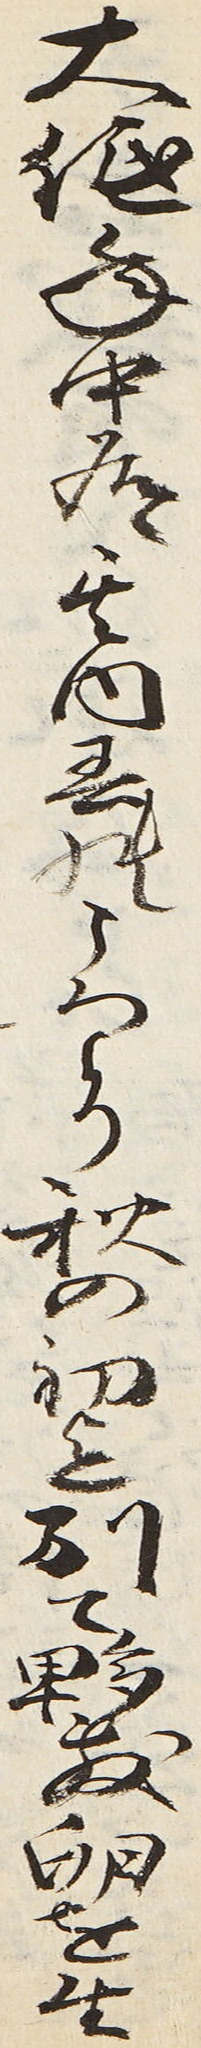大抵年中居候其内春のころより秋の初迄別て夥敷卵を生
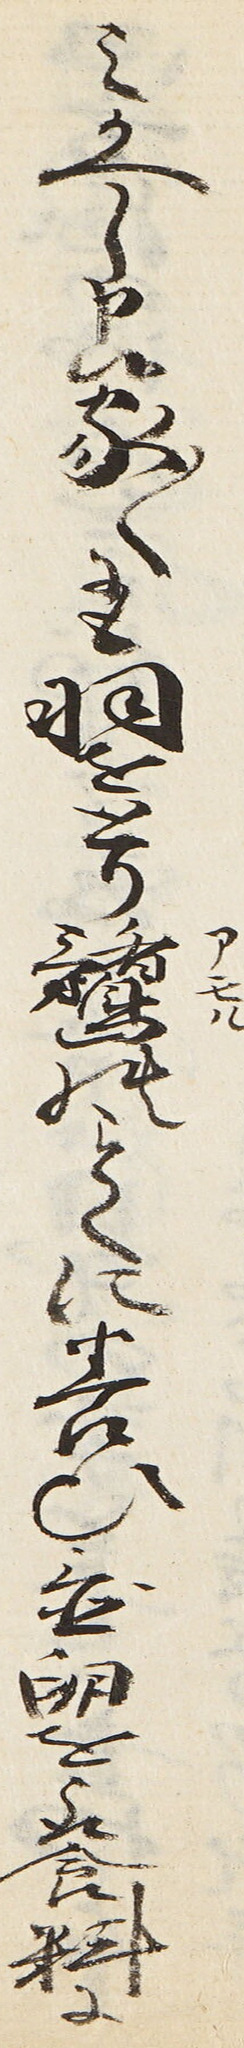みかへし申候家〳〵にも羽をとり鶩のことくに養ひ置卵を取食料に
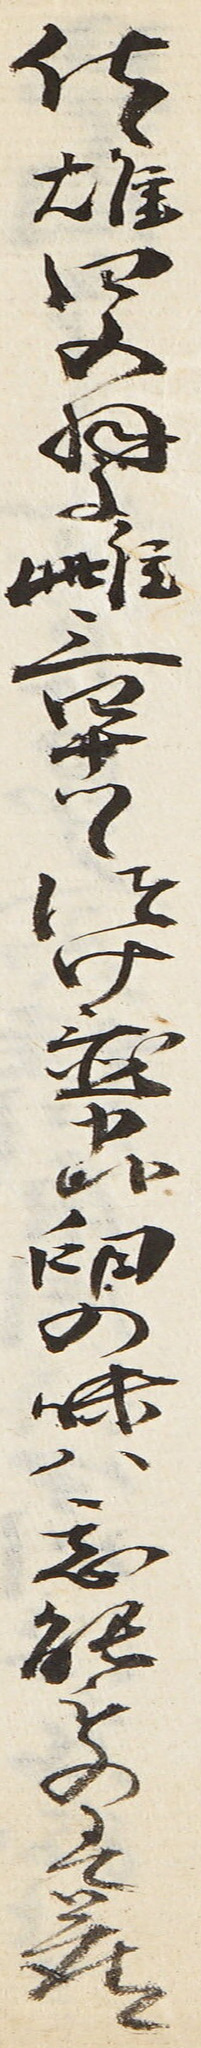仕候雄四五羽に雌三四十つゝつけ置申候卵の味は甚能ものにて御座候
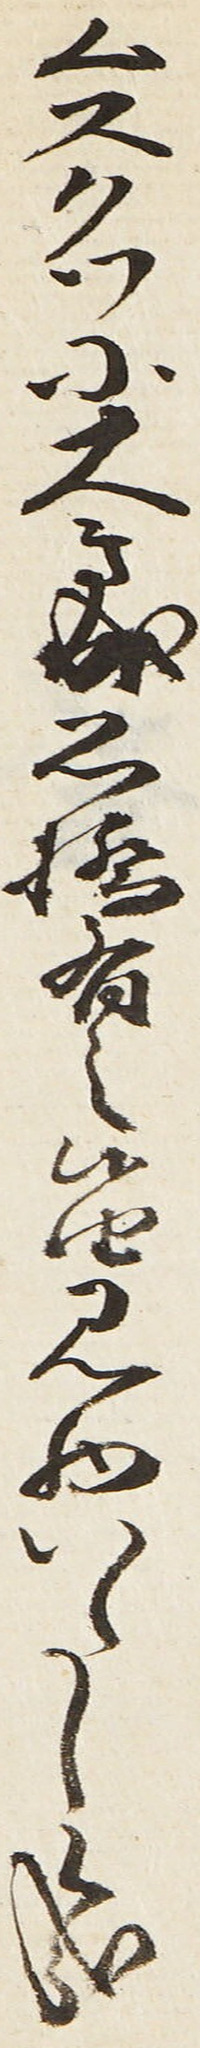ムスクワに大き成石橋有之候由見物いたし候哉
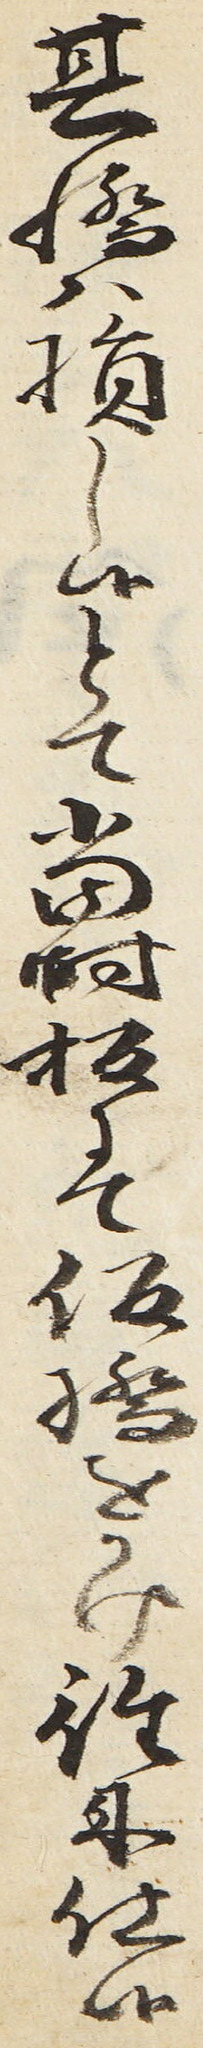其橋は損し候とて当時板にて仮橋をかけ往来仕候
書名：漂民御覧之記
